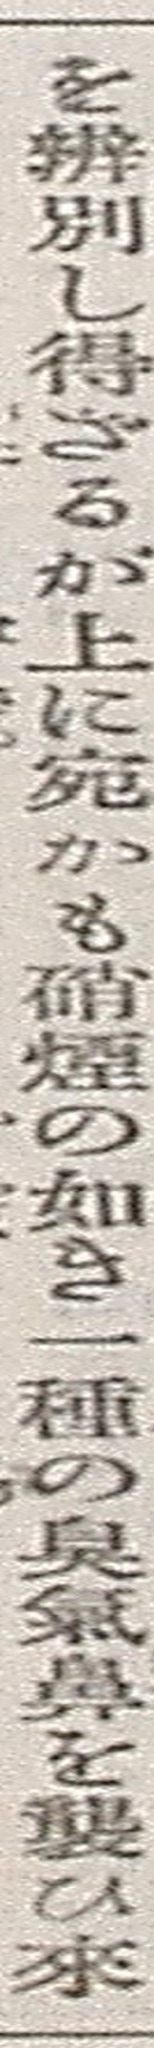を辨別し得ざるが上に宛かも硝煙の如き一種の臭気鼻を襲ひ来
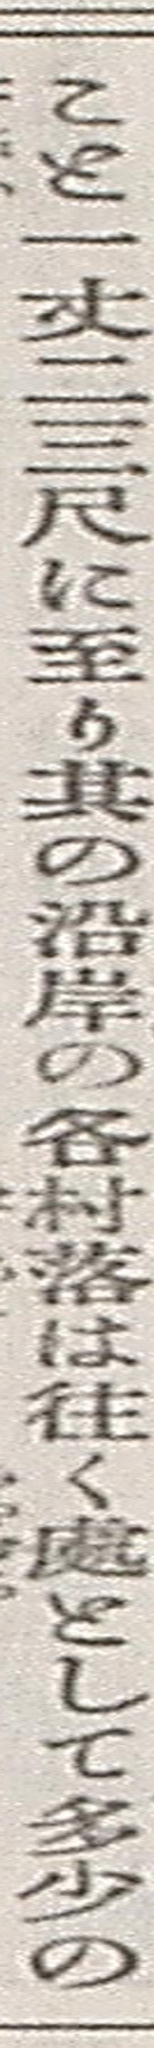こと一丈二三尺に至り其の沿岸の各村落は往く処として多少の
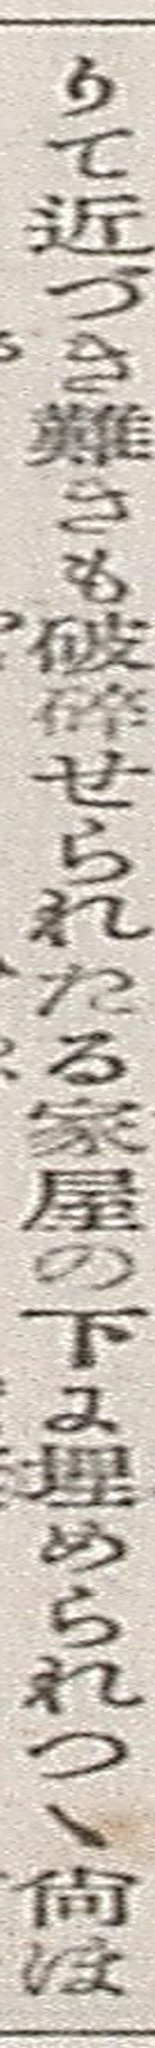りて近ぢき難きも破砕せられたる家屋の下に埋められつゝ尚ほ
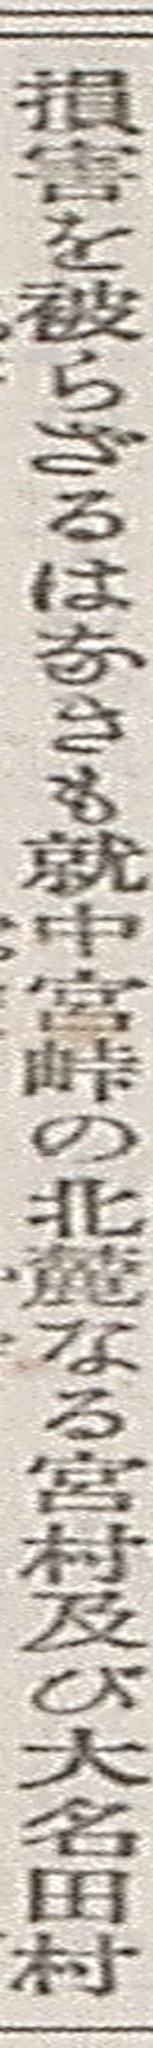損害を被らざるはなきも就中宮峠の北麓なる宮村及び大名田村
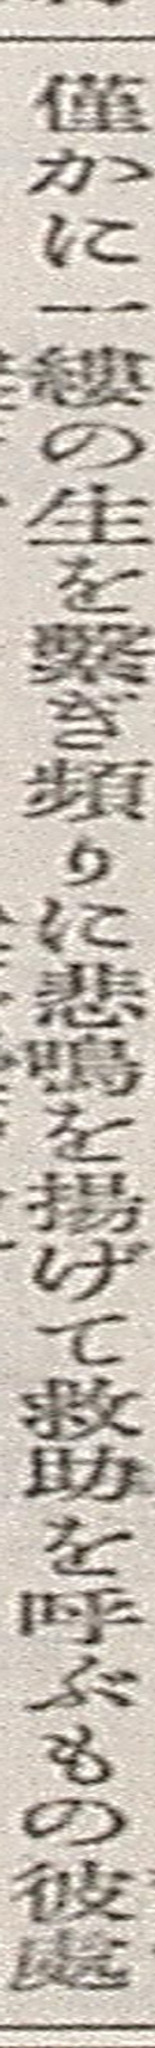僅かに一僂ぎ頻りに悲鳴を揚げて救助を呼ぶもの彼処
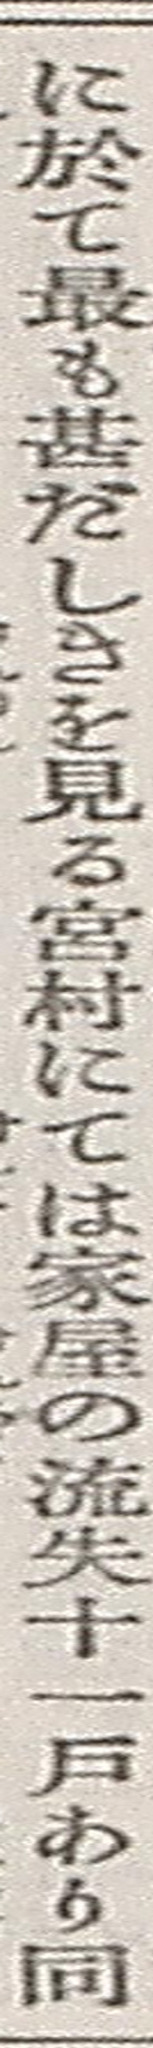に於そんがいて最も甚だしきを見る宮村にては家屋の流失十一戸あり同
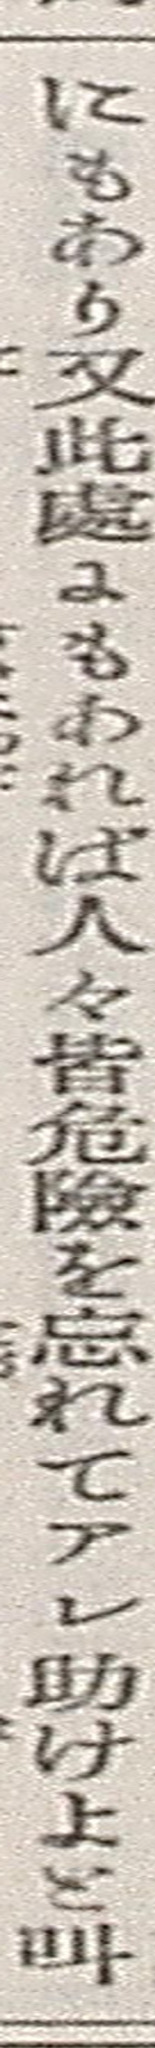にもあり又此処にもあれば人々皆危険を忘れてアレ助けよと叫
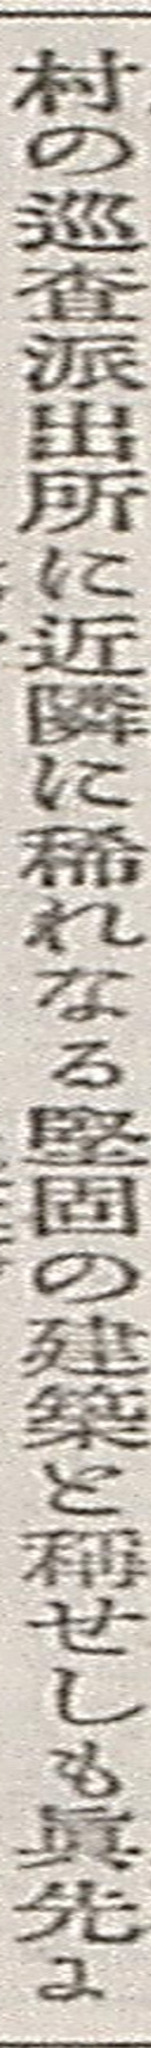村の巡査派出所に近隣に希れなる堅固の建築と称せしも真先に
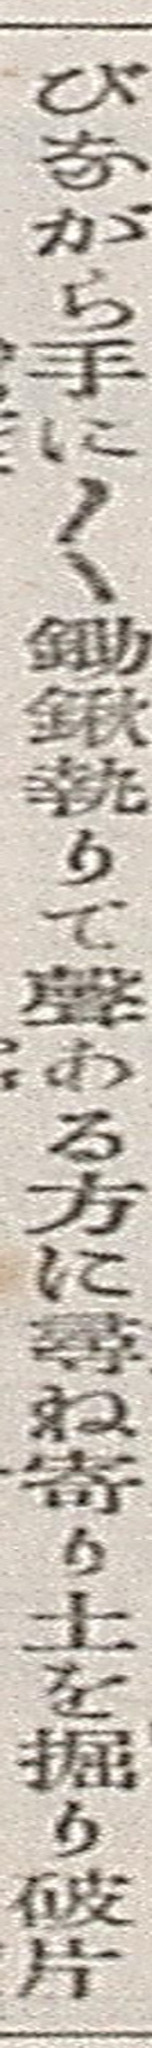びながら手に〳〵鋤鍬執りて声ある方に尋ね寄り土を掘り破片
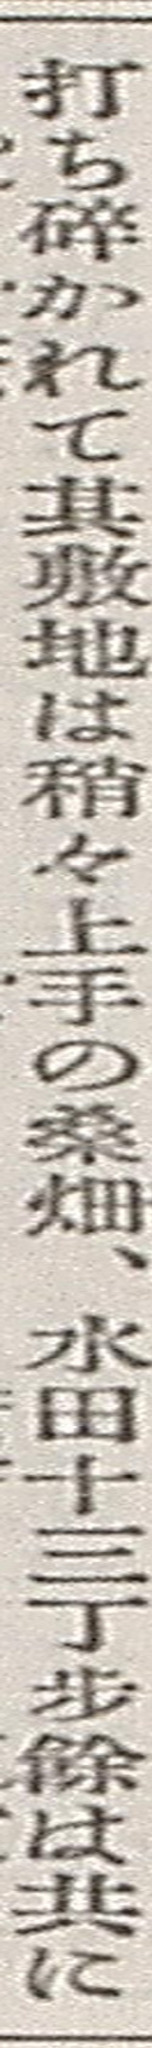打ち砕かれて其敷地は稍々上手の桑畑、水田十三町歩餘は共に
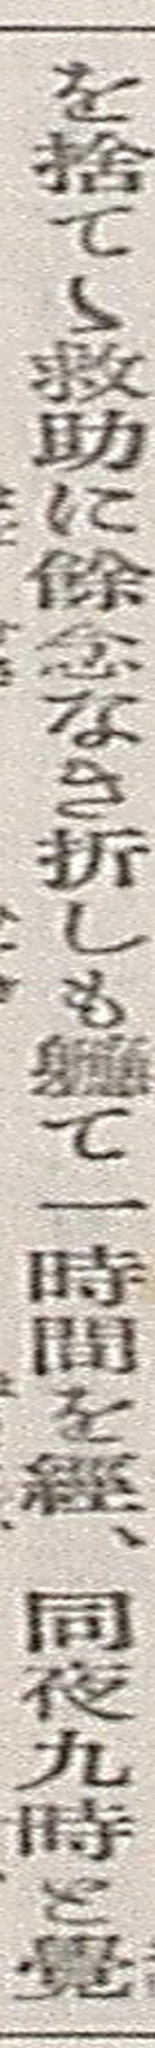を捨てゝ救助に餘念なき折しも軈て一時間を経、同夜九時と覚
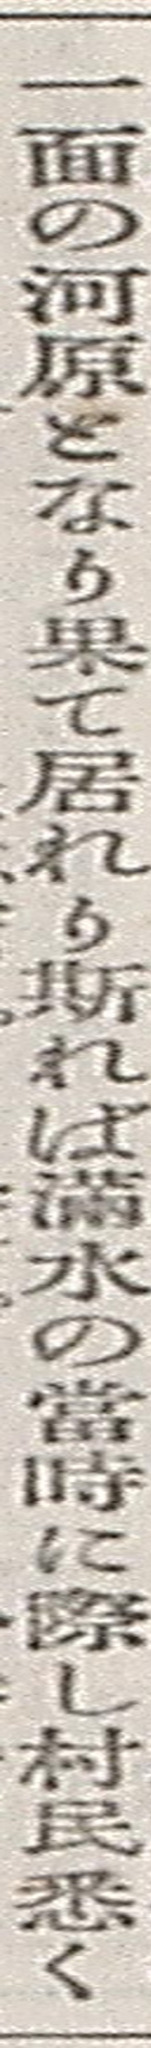一面の河原となり果て居れり斯れば満水の当時に際し村民悉く
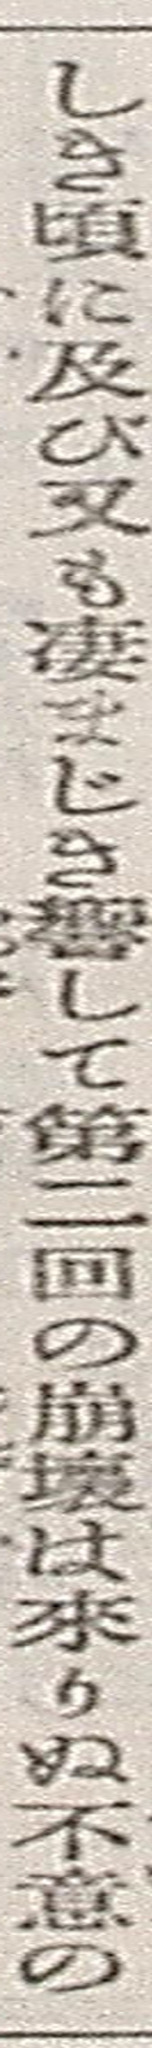しき頃に及び又も凄まじき響して第二回の崩壊は来りぬ不意の
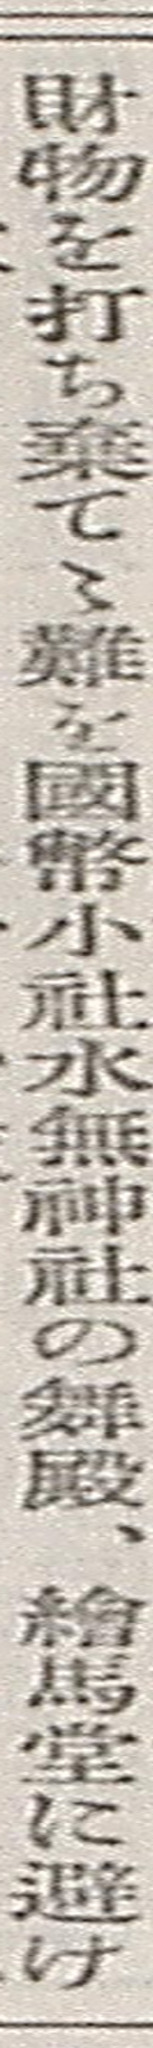財物を打ち棄て々難を國幣小社水無神社の舞殿、絵馬堂に避け
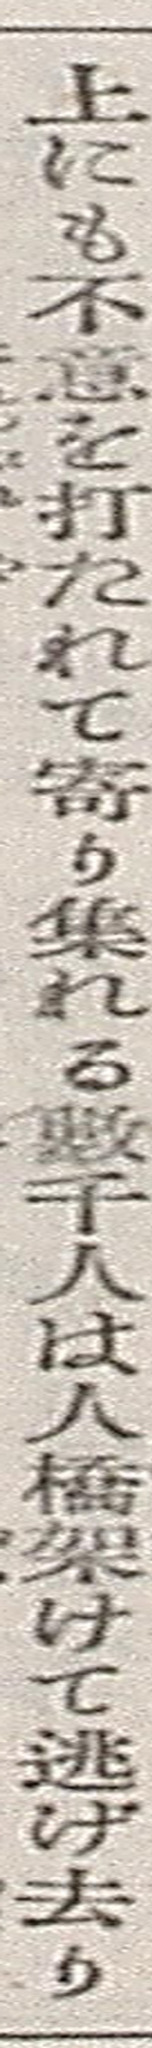上にも不意を打たれて寄り集れる数千人は人橋架けて逃げ去り
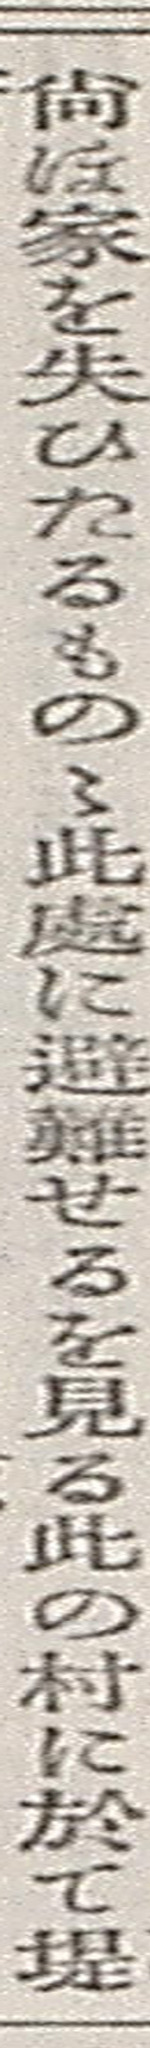尚ほ家を失ひたるものゝ此処に避難せるを見る此の村に於て堤
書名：風俗畫報臨時増刊第百二十八號　洪水被害録（下）
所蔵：東京大学地震研究所図書室 Earthquake Research Institute Library, The University of Tokyo, JAPAN
